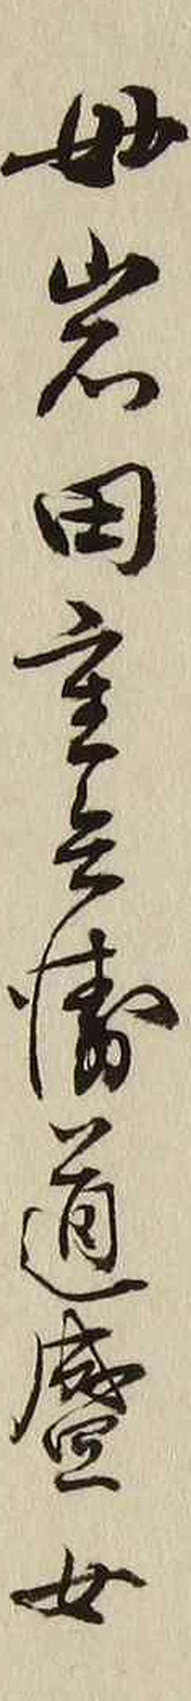母岩田重兵衛道盛女
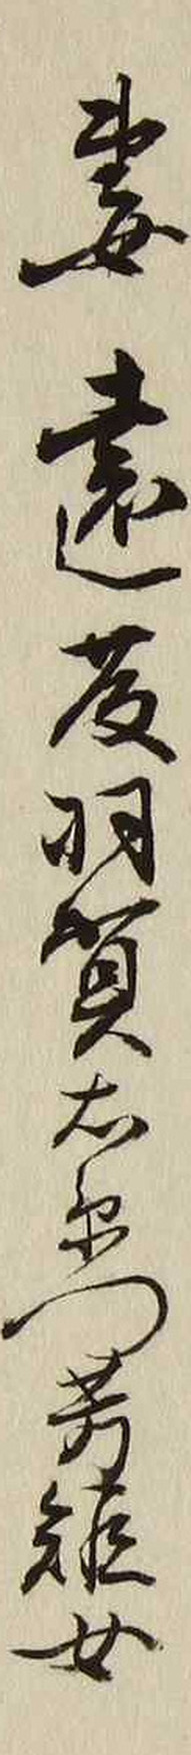妻遠藤羽賀右衛門芳矩女
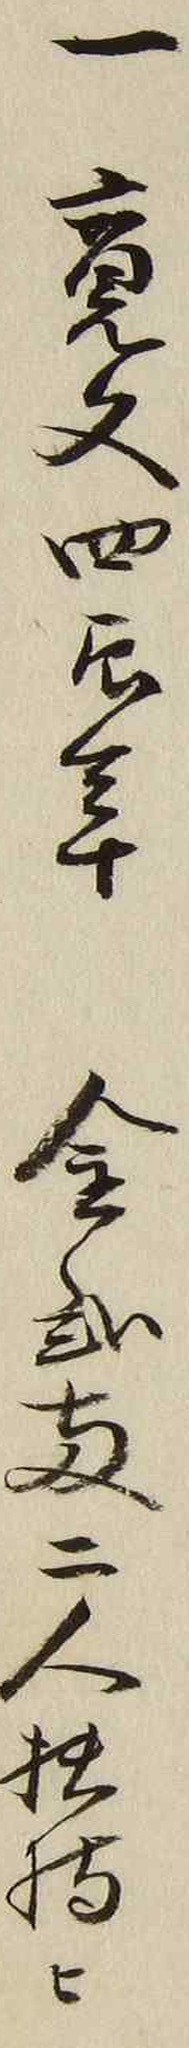一寛文四辰年金弐両二人扶持被
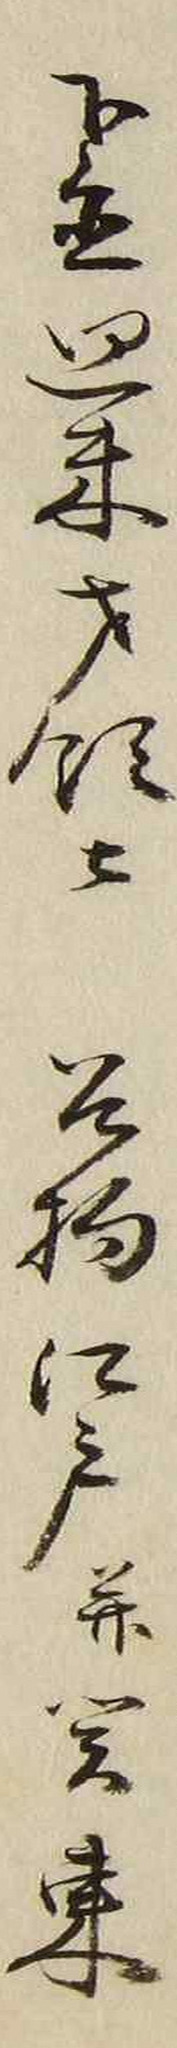下置廻米才領被召抱江戸并関東

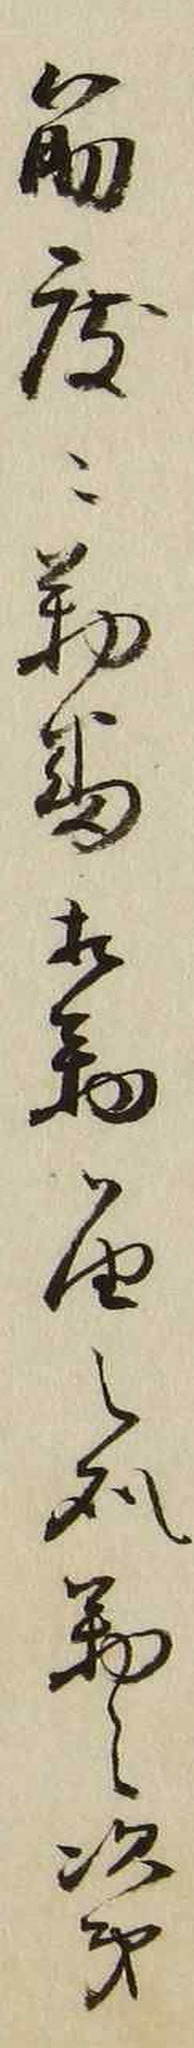筋度々勤番相勤候由之処勤之次第
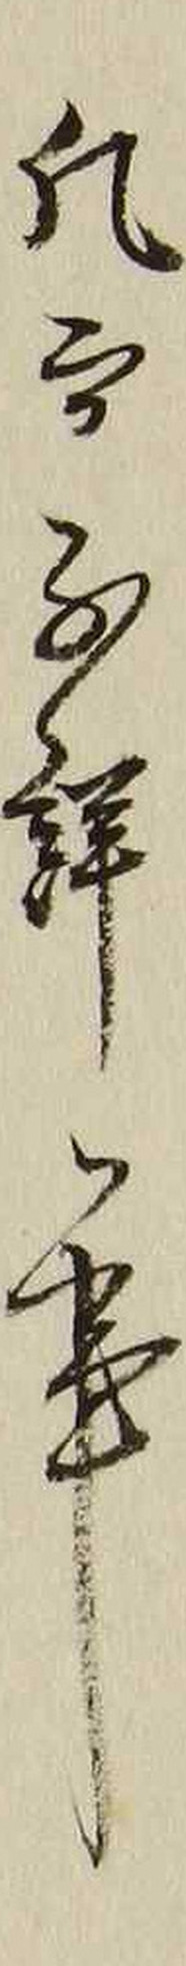凡而不詳候事
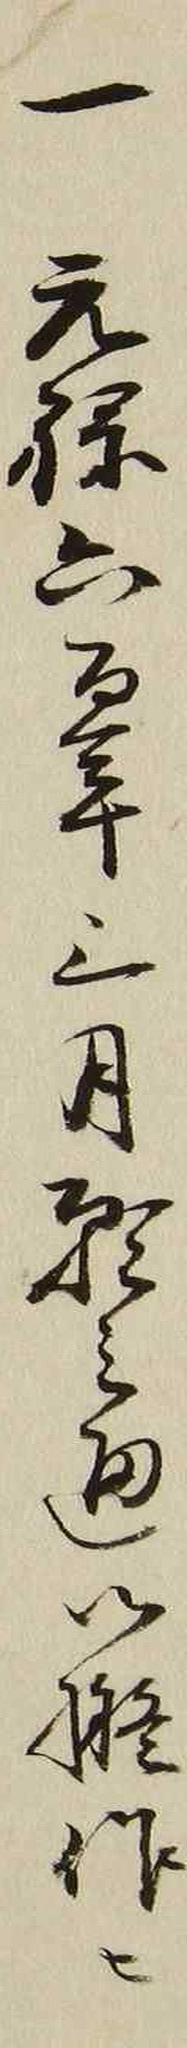一元禄六酉年三月願之通御擬作被
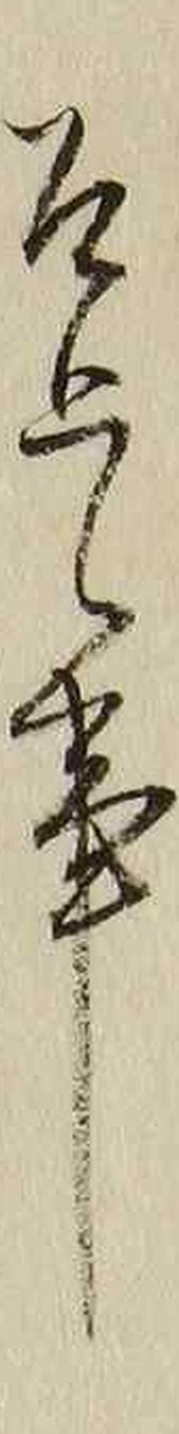召上候事
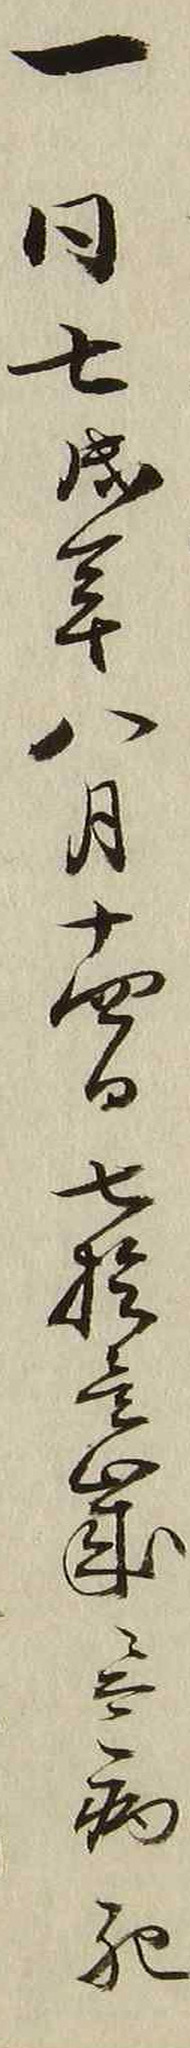一同七戌年八月十四日七拾壱歳ニ而病死
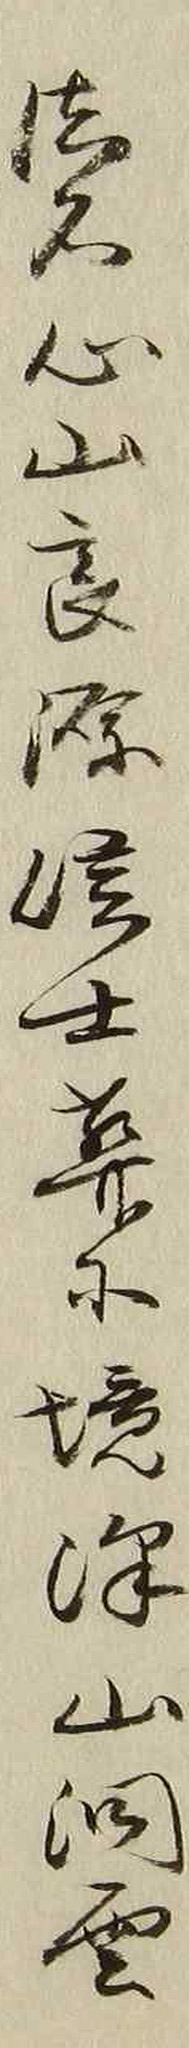法名心山良源信士葬所境沢山洞雲
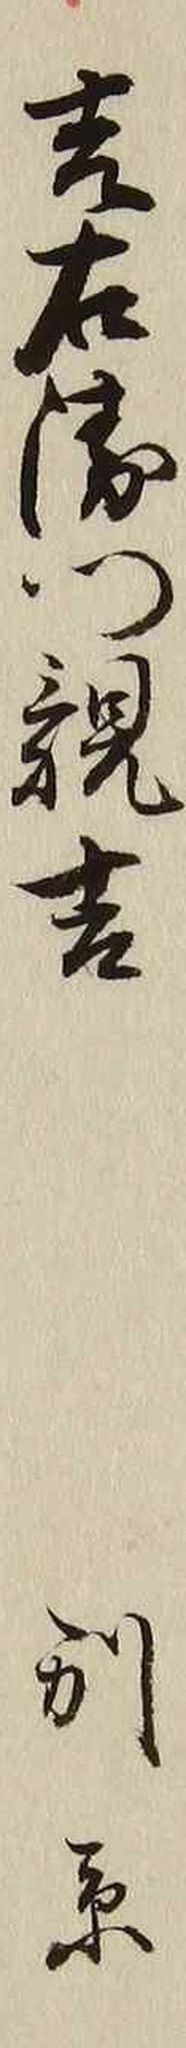吉右衛門親吉別系
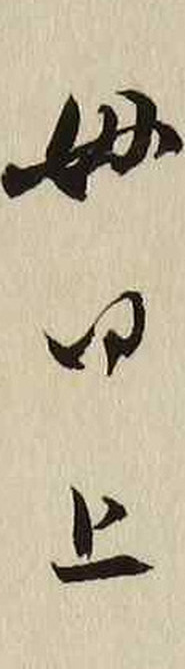母同上
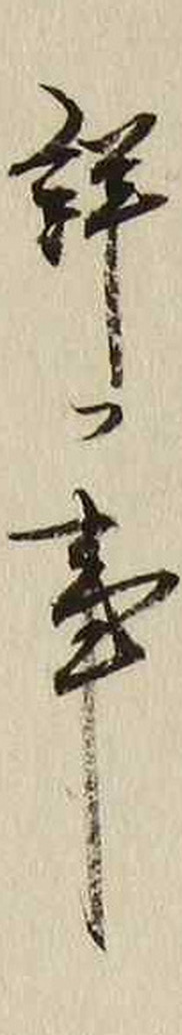詳候事
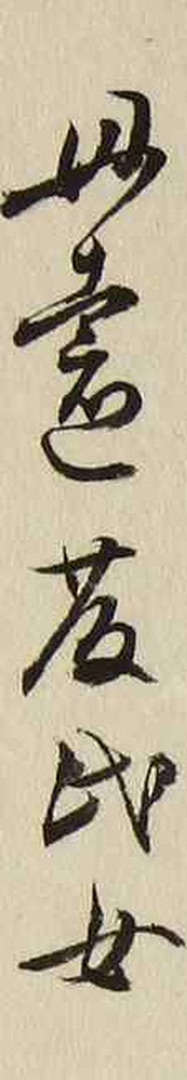母遠藤氏女
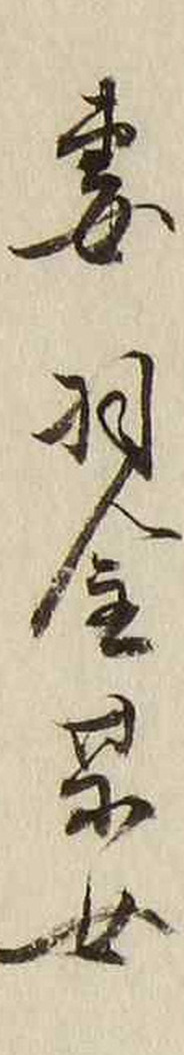妻羽金某女

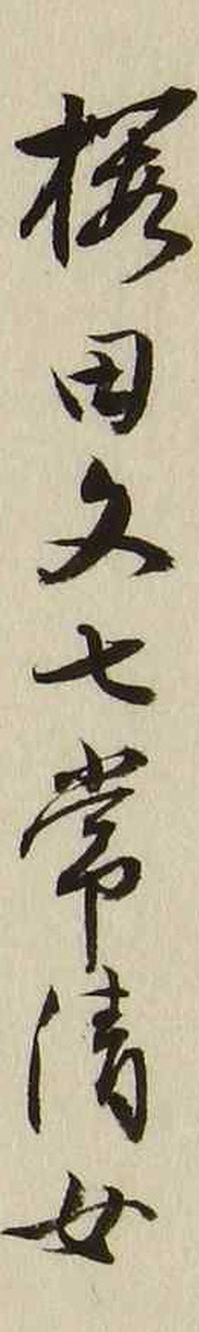桜田文七常清女
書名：諸士系譜　巻之291　さ之部23
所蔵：会津若松市立会津図書館
